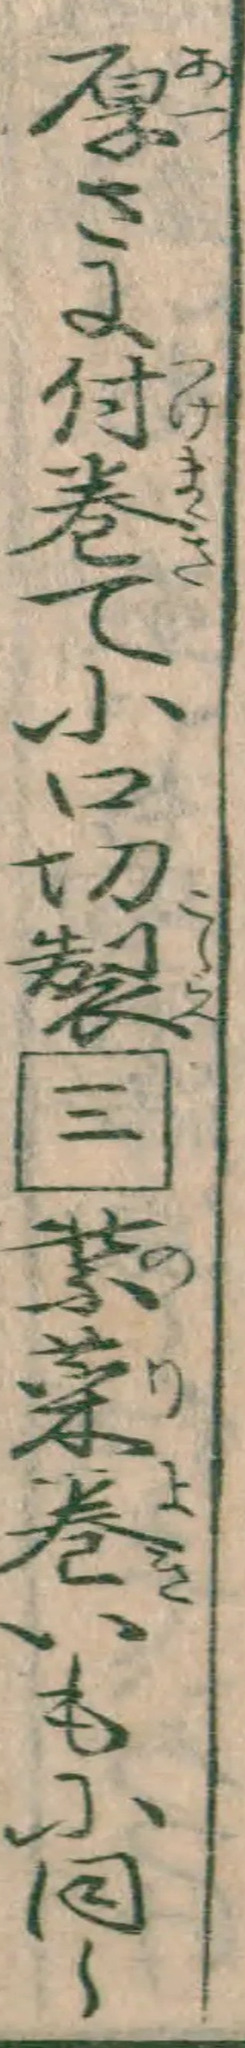厚さに付巻て小口切製[三]紫菜巻いもに同し
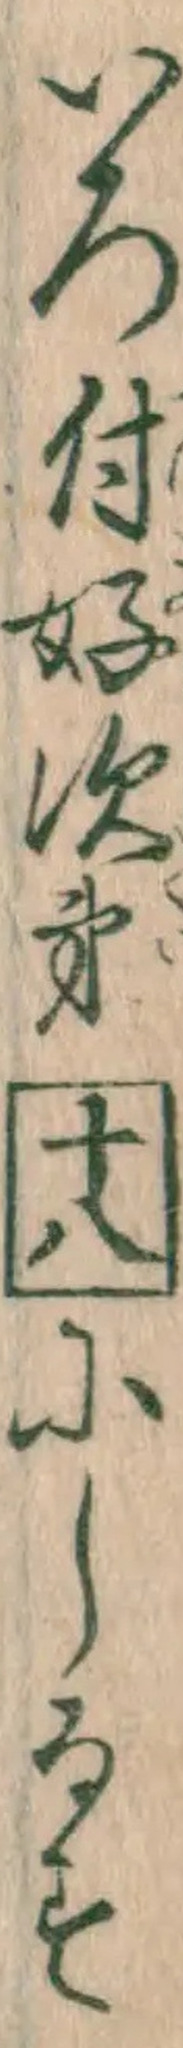いろ付好次第[十八]にしるす
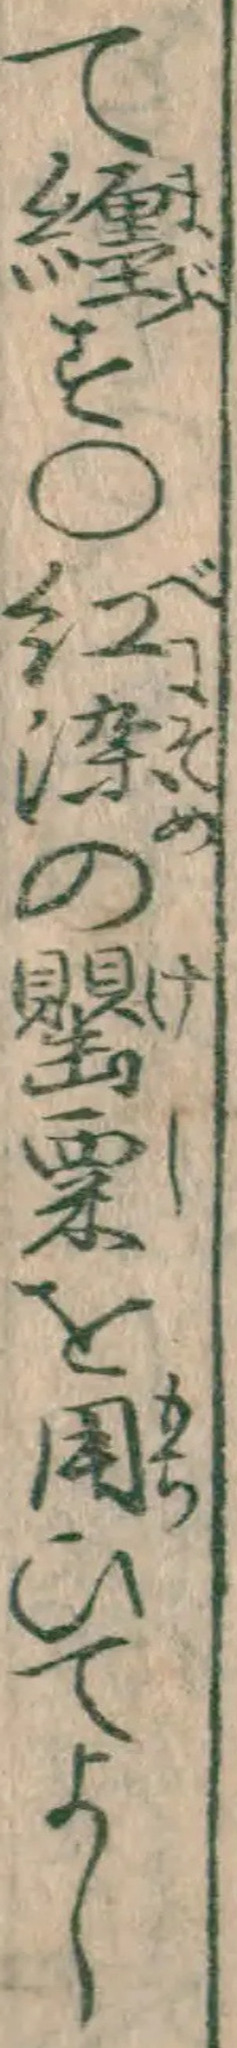て纏す○紅染の罌粟を用ひてよし
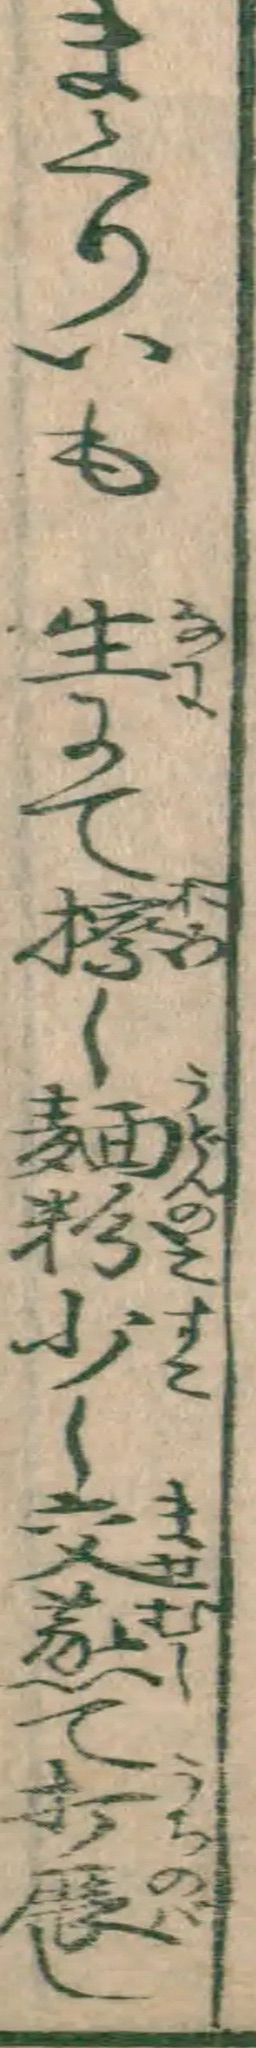[十五]まくりいも生にて擦し麺粉少し交蒸打展し
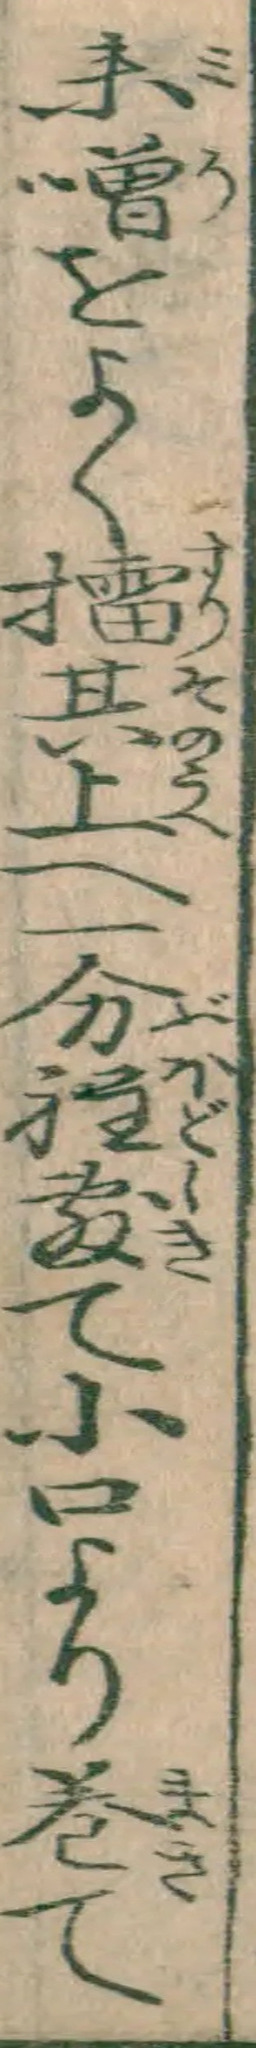未噌をよく擂其上へ一分程敷て小口より巻て

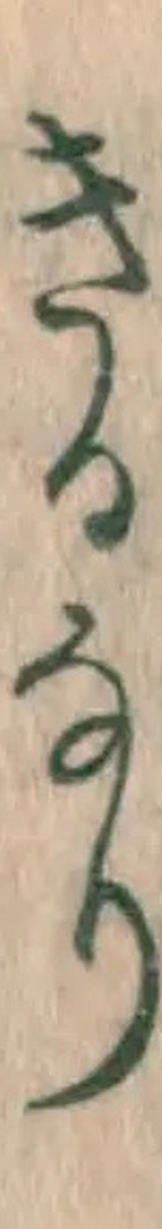きるなり
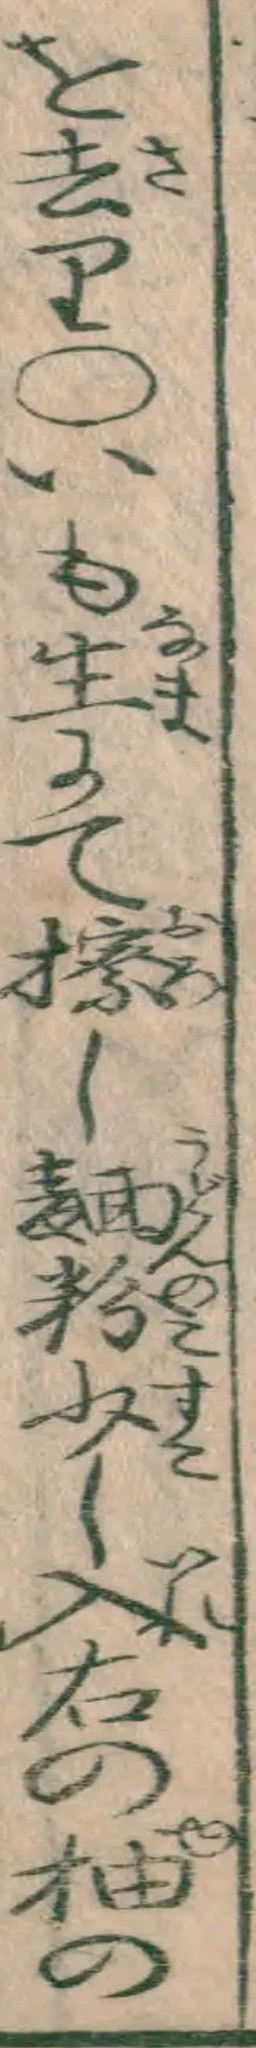を去り○いも生にて擦し麺粉少し入右の柚の
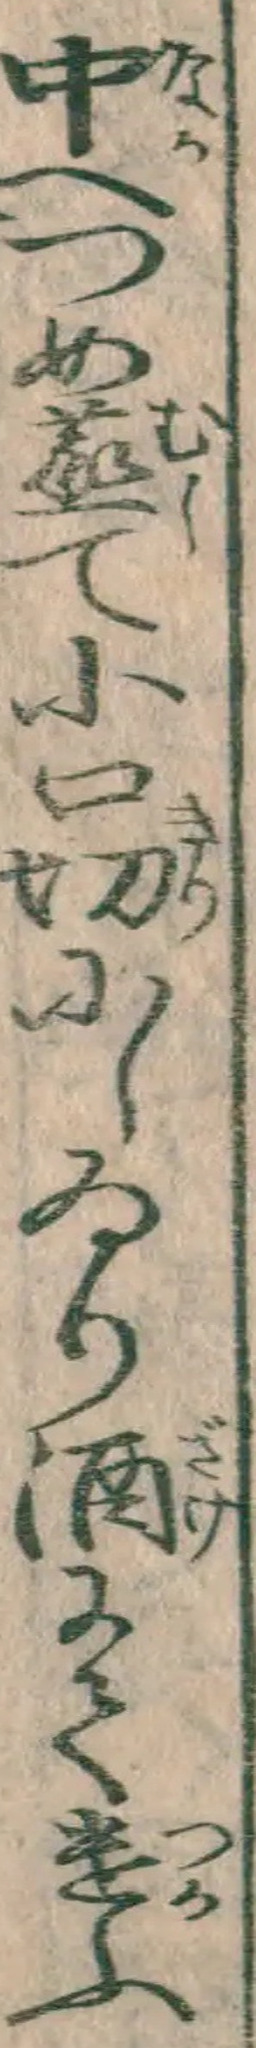中へつめ蒸て小口切にしゐり酒にて遣ふ
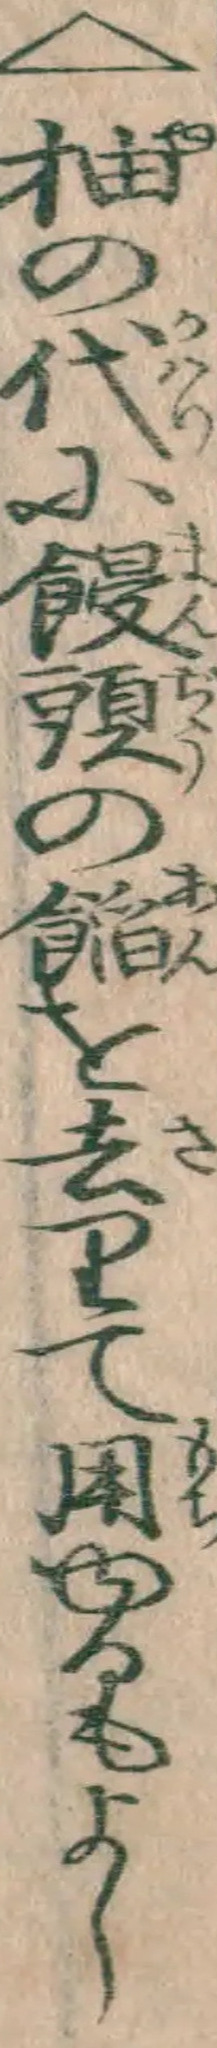△柚の代に饅頭の餡を去りて用ゆるもよし
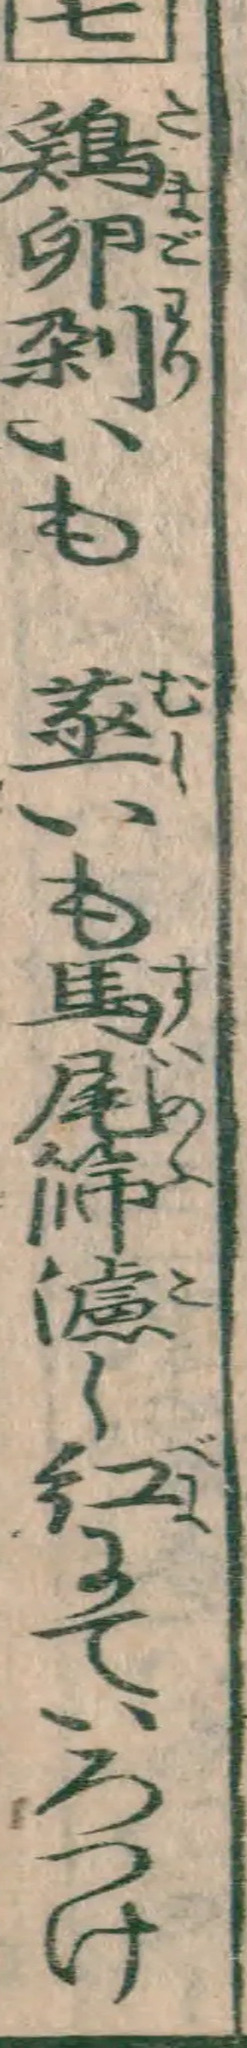[十七]鶏卵刴いも蒸いも馬尾篩濾し紅にていろつけ
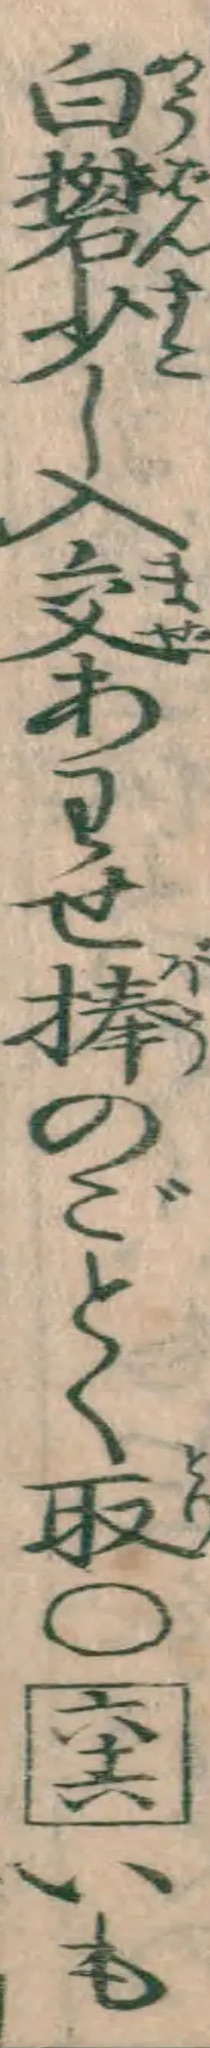白礬少し入交あわせ棒のごとく取○[六十六]いも
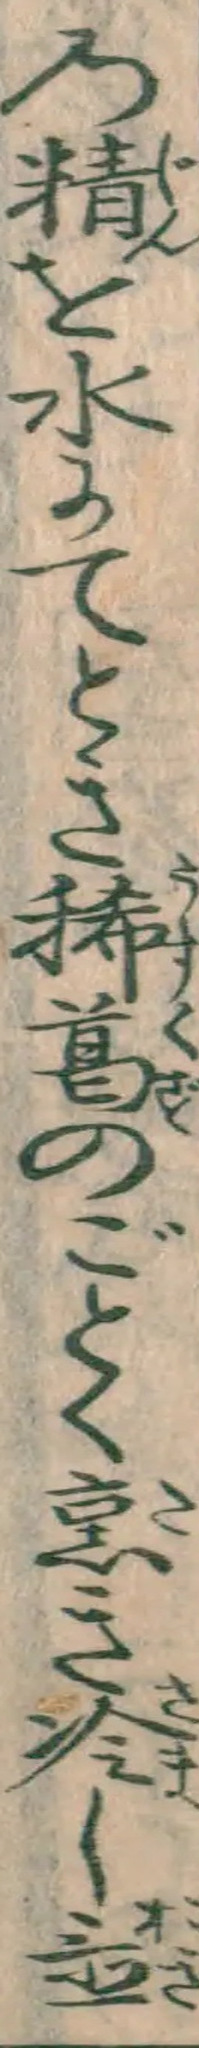の精を水にてとき稀葛のごとく烹き冷し置
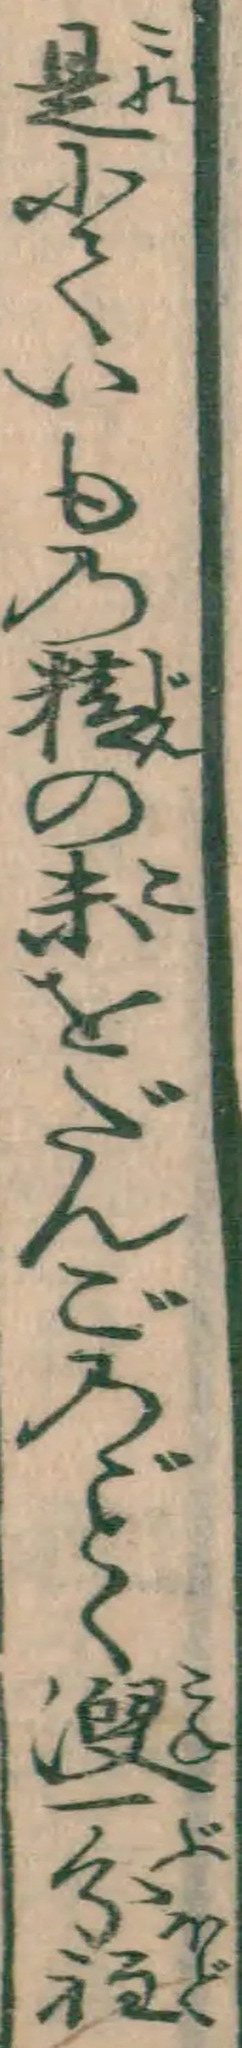是にていもの精の未をだんごのごとく溲一分程
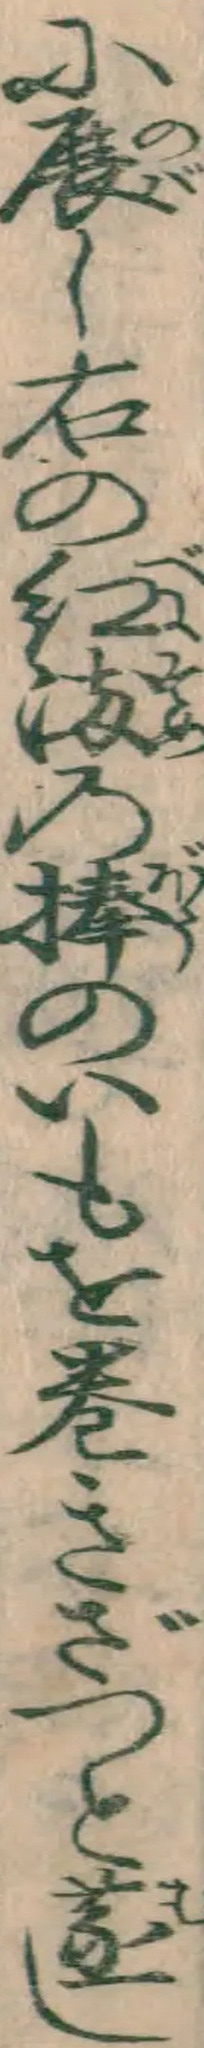に展し右の紅染の棒のいもを巻きざつと蒸し
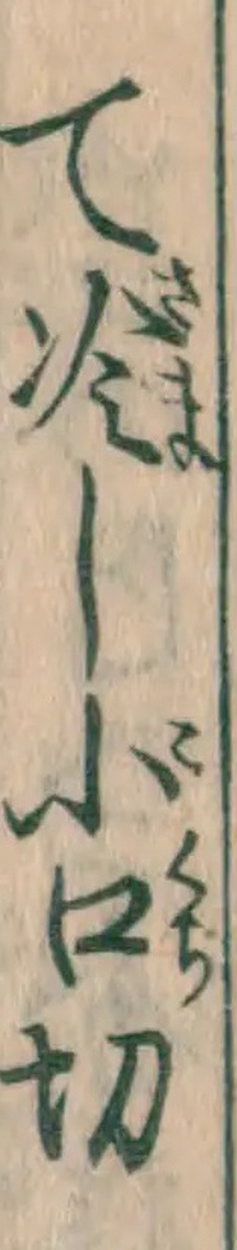て冷し小口切
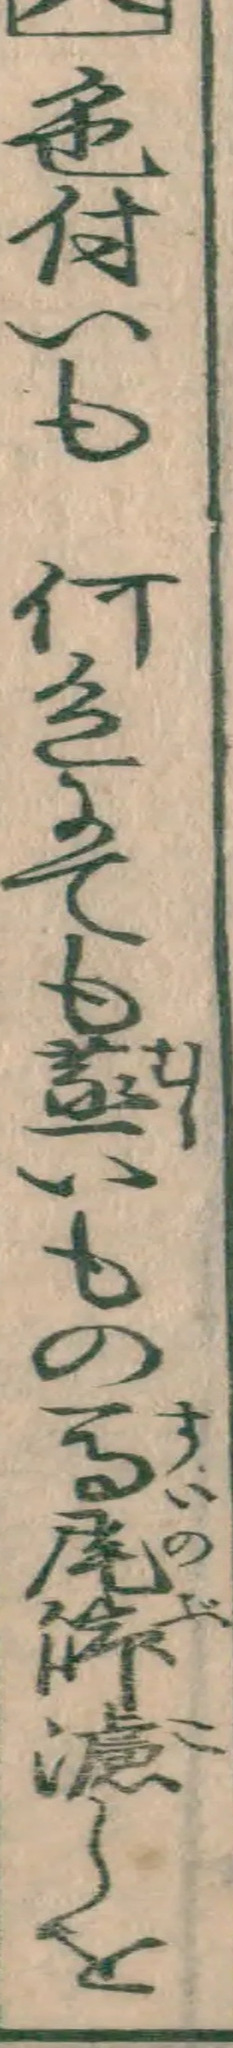[十八]色付いも何色にても蒸いもの馬尾篩濾しを
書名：甘藷百珍
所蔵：国立国会図書館 National Diet Library, JAPAN
